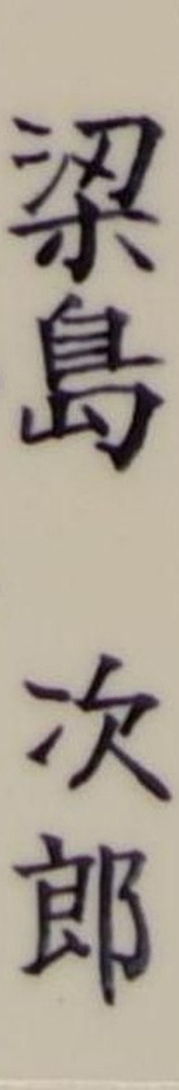梁島次郎
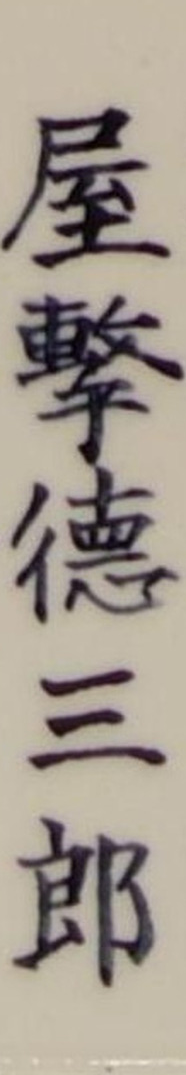屋撃徳三郎
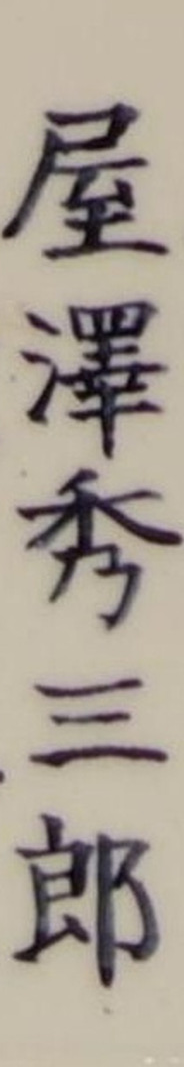屋澤秀三郎
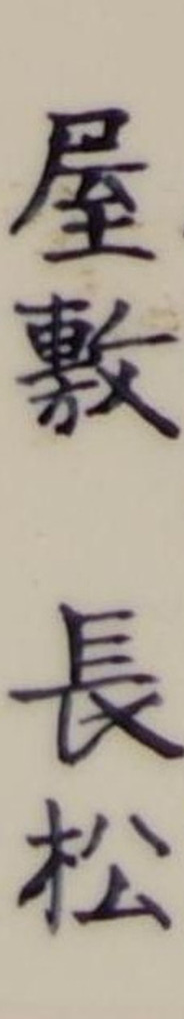屋敷長松
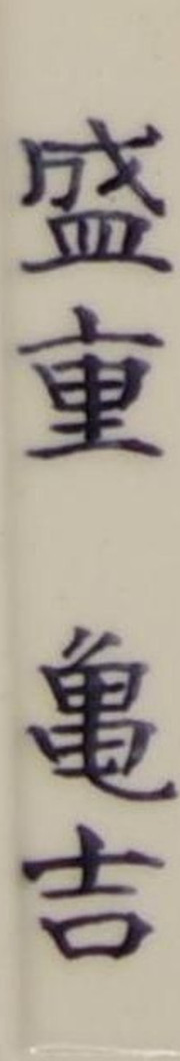盛重亀吉

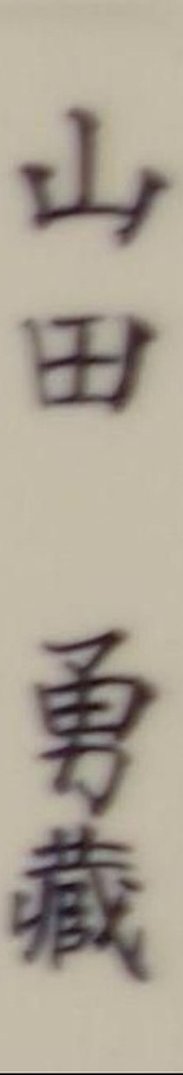山田勇蔵
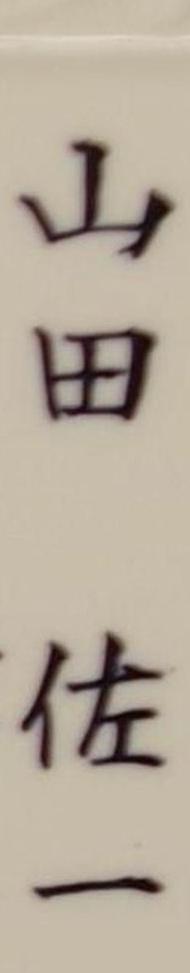山田佐一
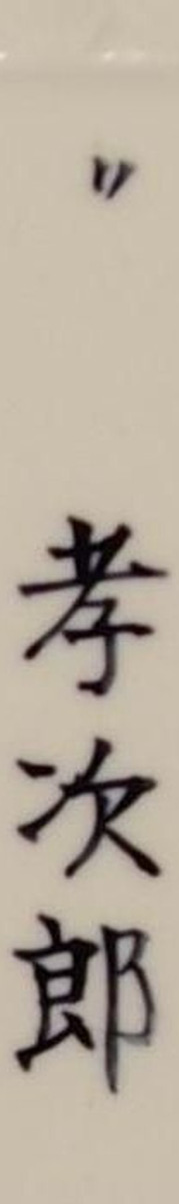孝次郎
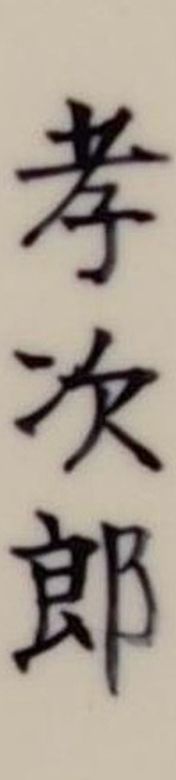孝次郎
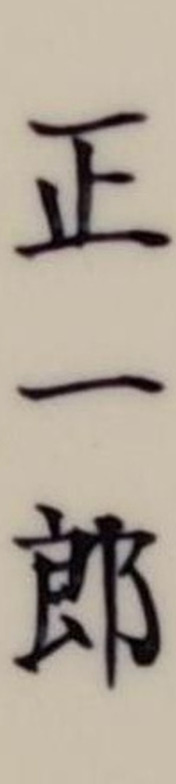正一郎
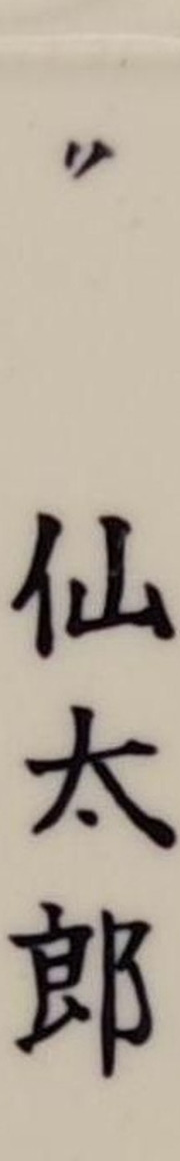仙太郎
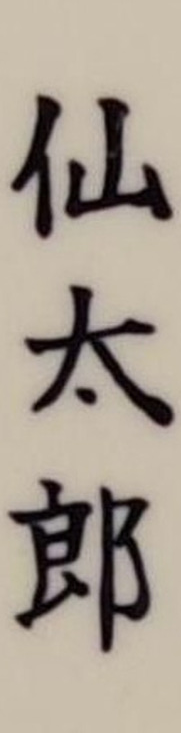仙太郎
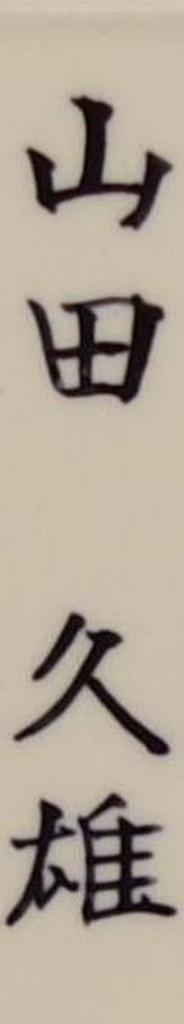山田久雄

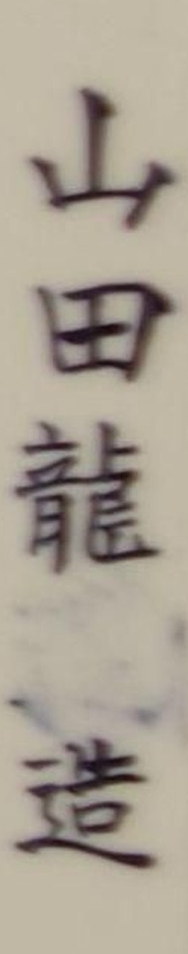山田龍造
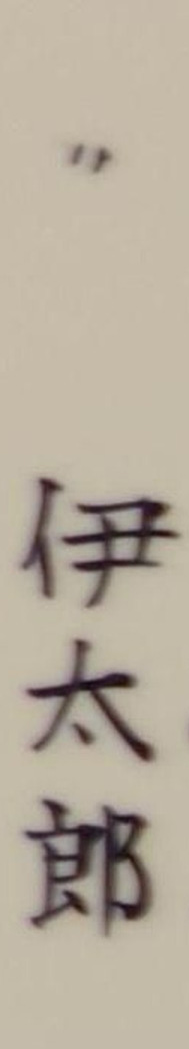伊太郎
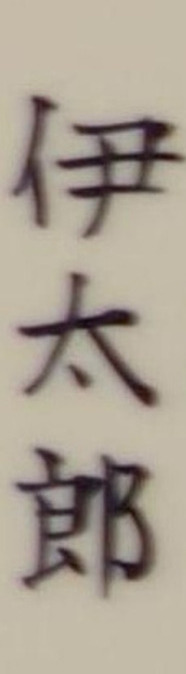伊太郎
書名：M~S
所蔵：高野山金剛峯寺
